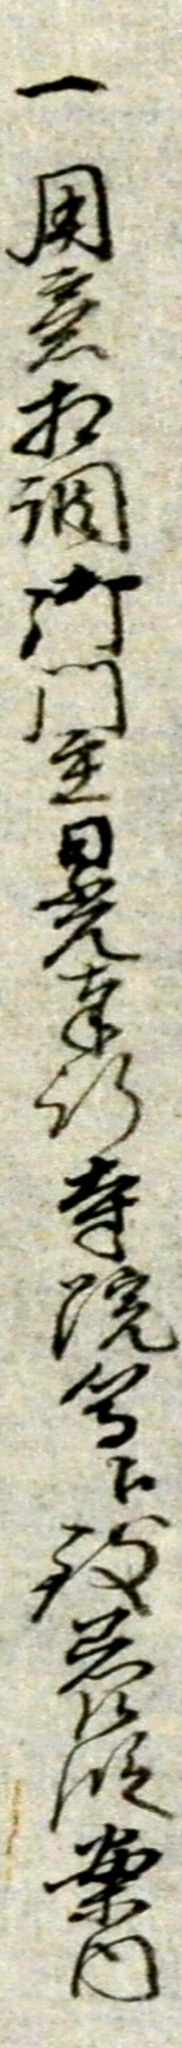一用意相調御門主日光奉行寺院等江致着候段案内
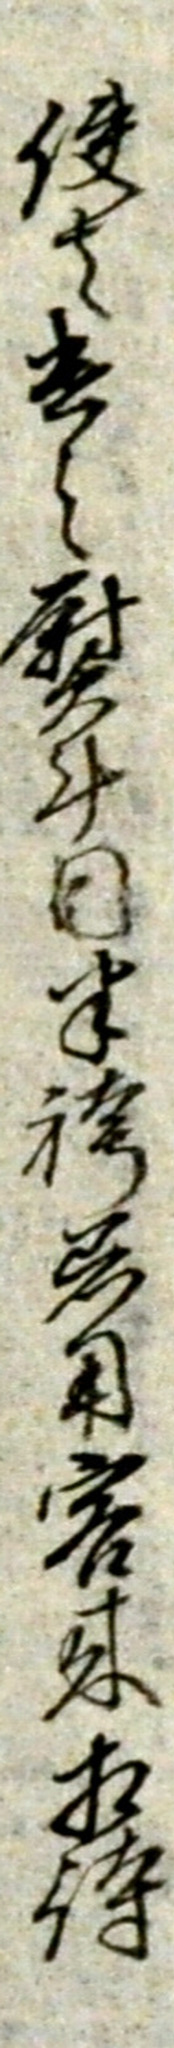使者遣之熨斗目半袴着用客来相待
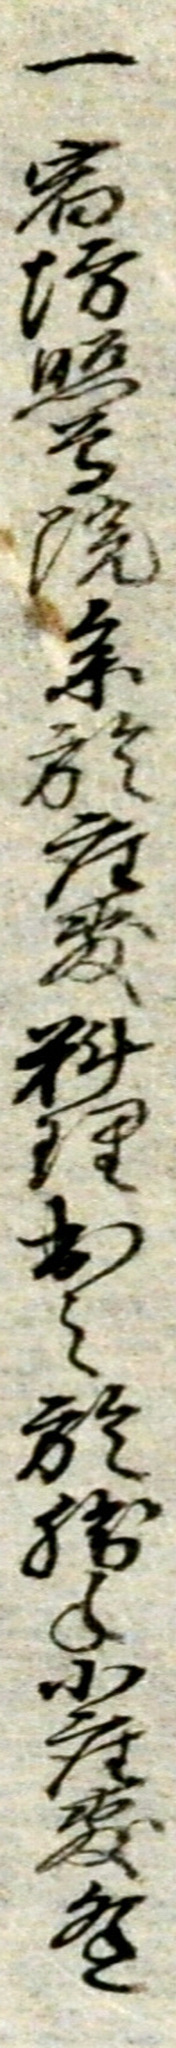一宿坊照尊院参於座敷料理出之於勝手小座敷逢
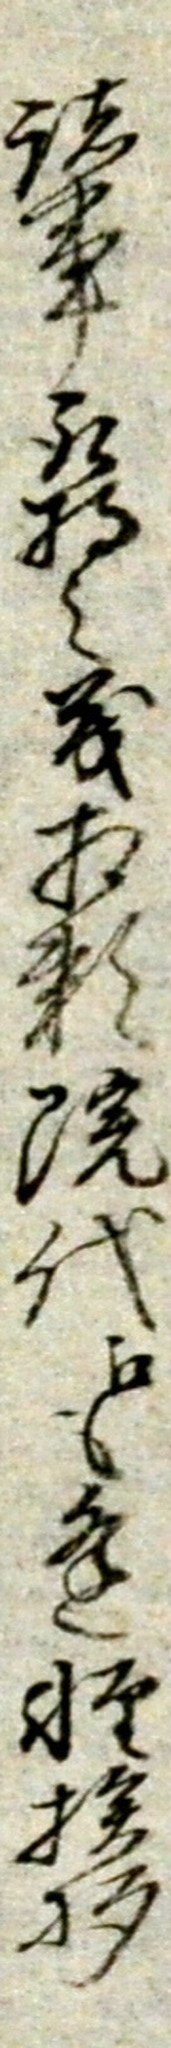諸事取持之義相頼院代江も逢軽挨拶
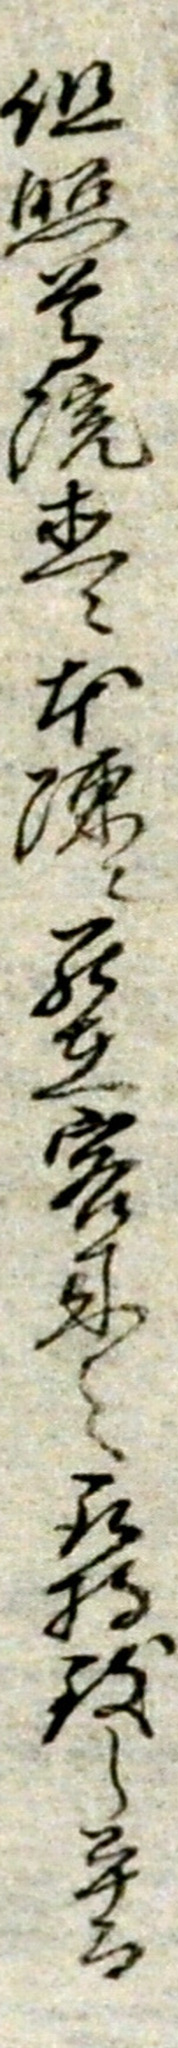但照尊院直ニ本陣ニ罷在客来之取持致し畢而
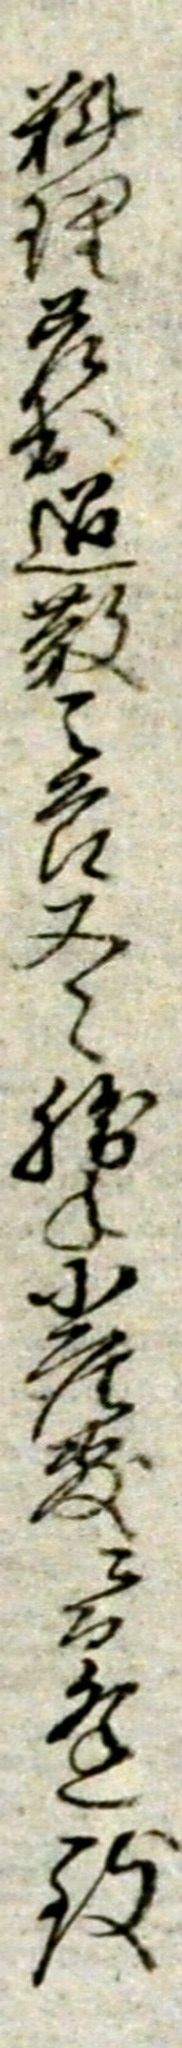料理差出退散之節又々勝手小座敷ニ而逢致
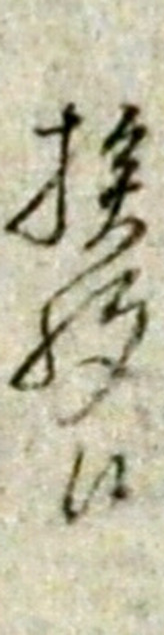挨拶候
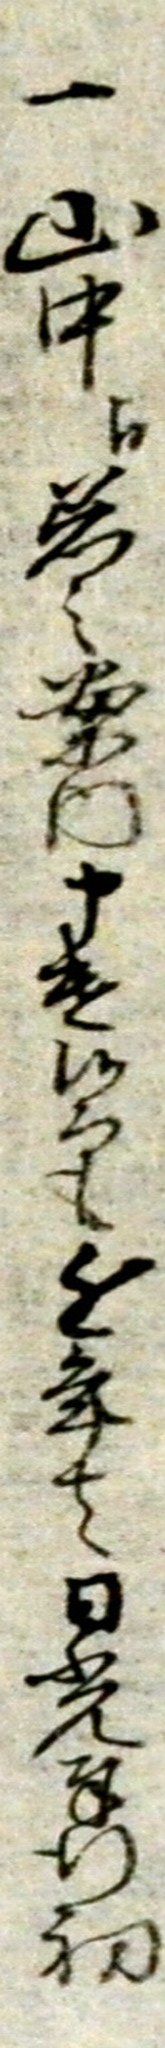一山中江着之案内申遣候而も近年者日光奉行初
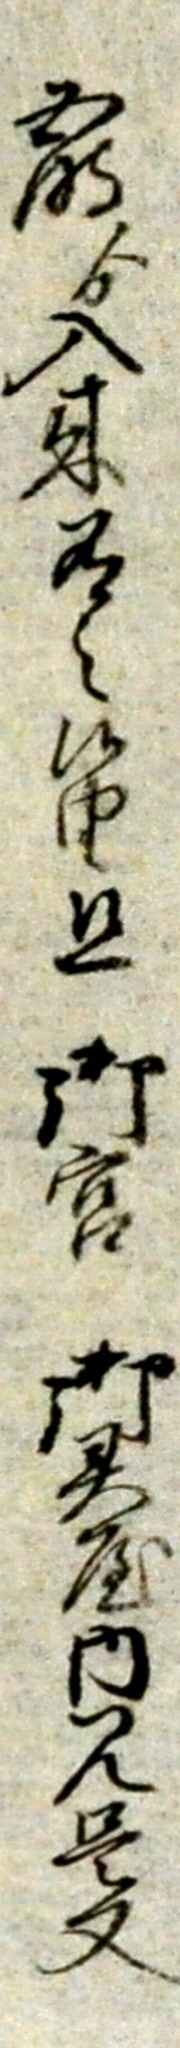五時ゟ入来有之候由且御宮御霊屋内見是又
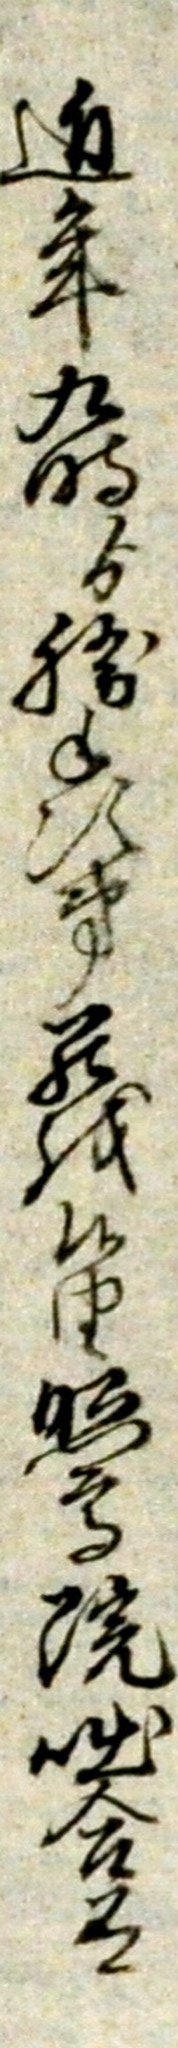近年九時ゟ勝手次第罷越候由照尊院咄合有
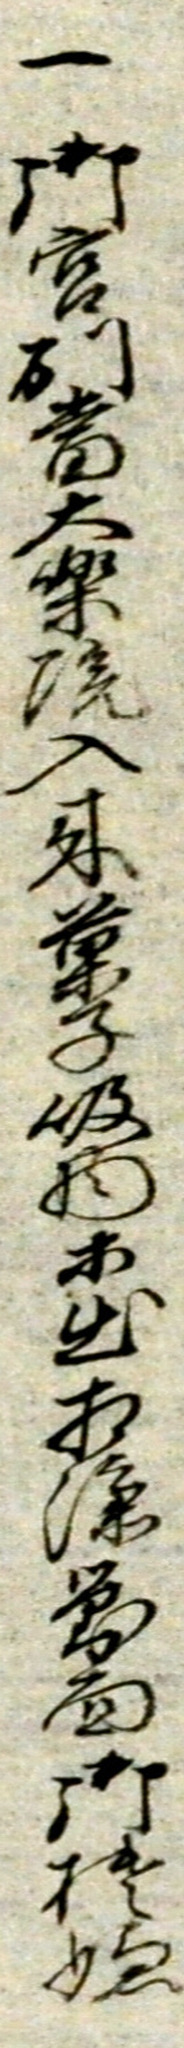一御宮別当大楽院入来菓子吸物等出相済対面御機嫌
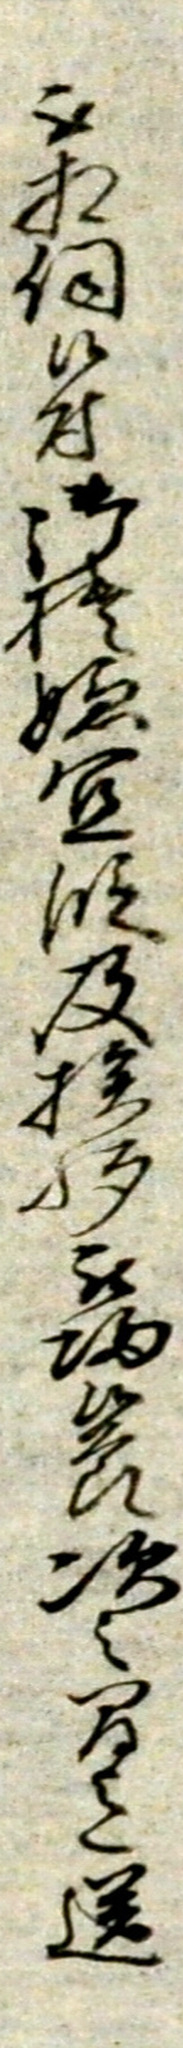被相伺候付御機嫌宜段及挨拶被帰候節次之間迄送
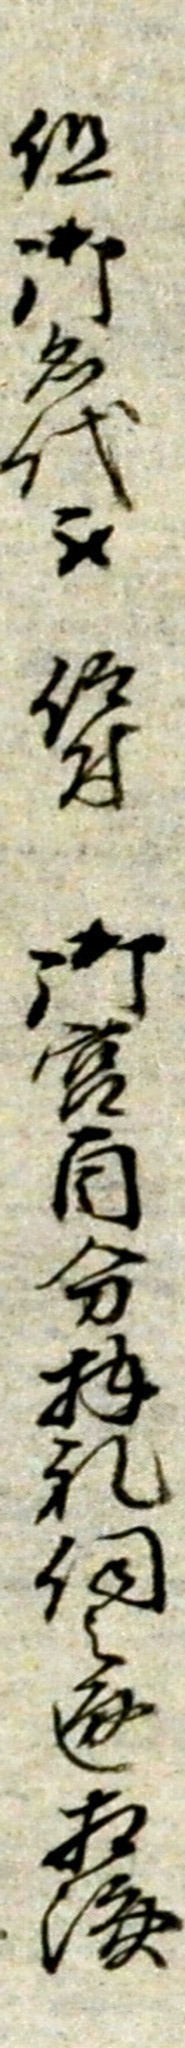但御名代被仰付御宮自分拝礼伺之通相済
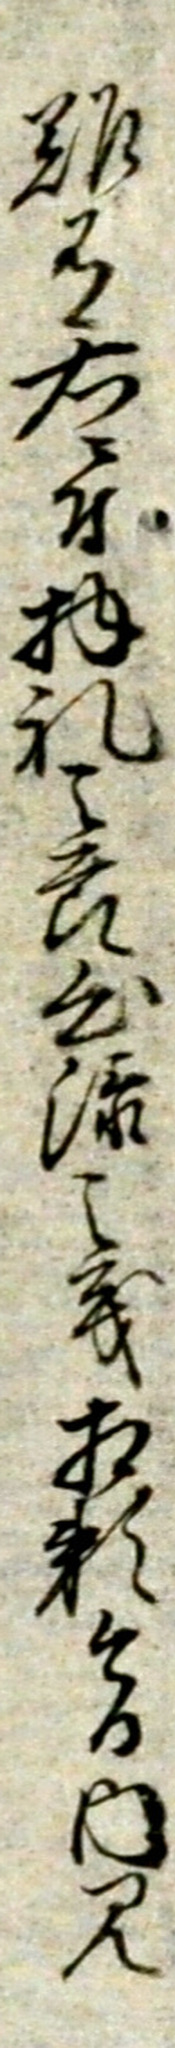難有右ニ付拝礼之節心添之義相頼今日内見
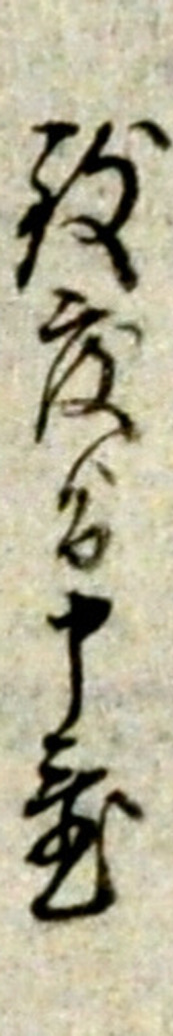致度旨申置
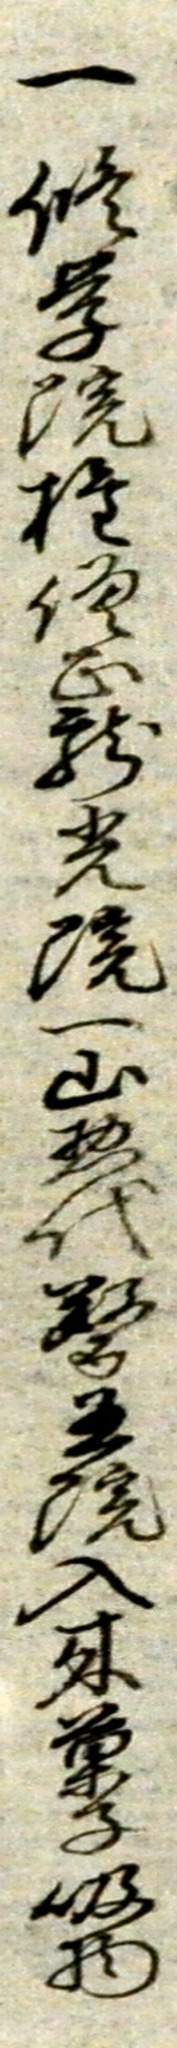一修学院権僧正龍光院一山惣代医王院入来菓子吸物
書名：日光御名代相勤候節ノ留
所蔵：伊那市立高遠町図書館・合同会社AMANE
